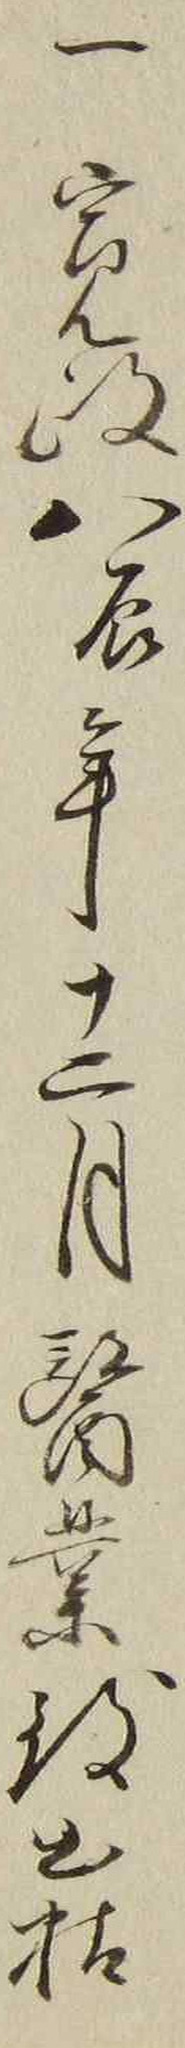一寛政八辰年十二月医業致出精
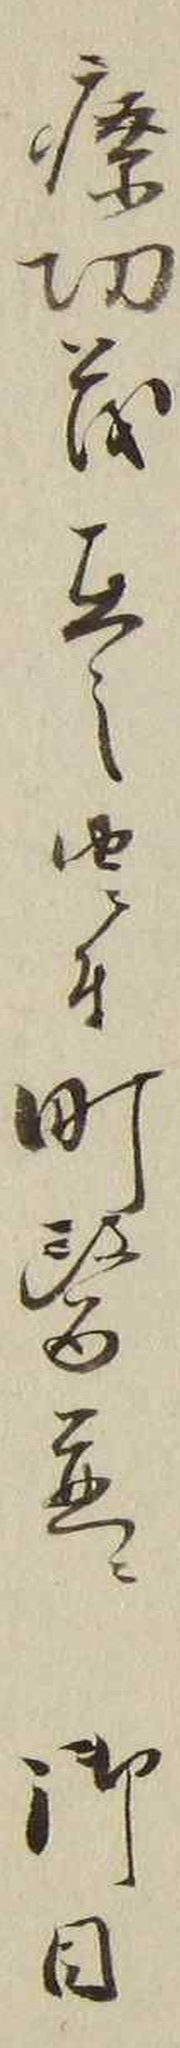療功も在之由ニ付町医並ニ御目

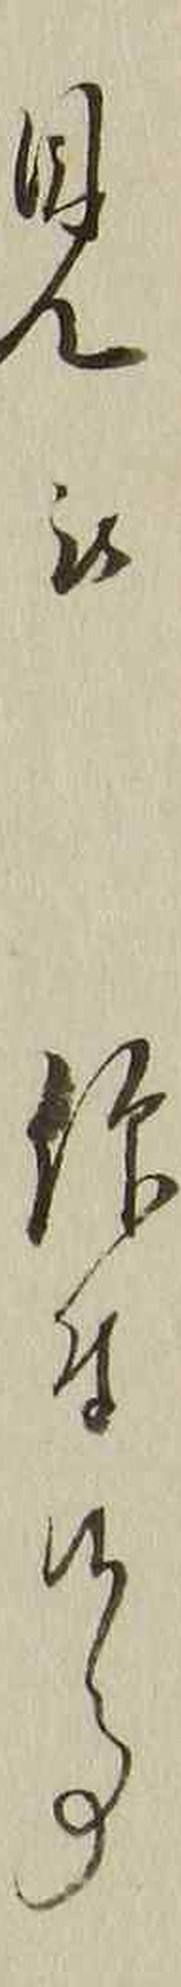見被仰付候事
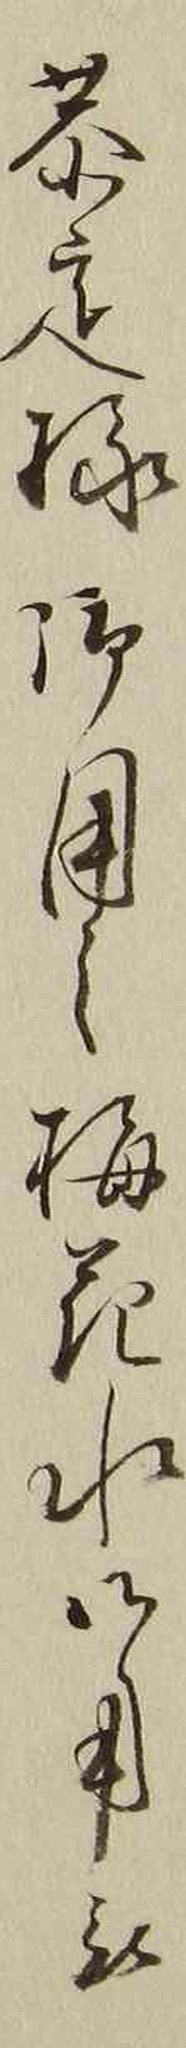恭定様御用之梅花水御用被
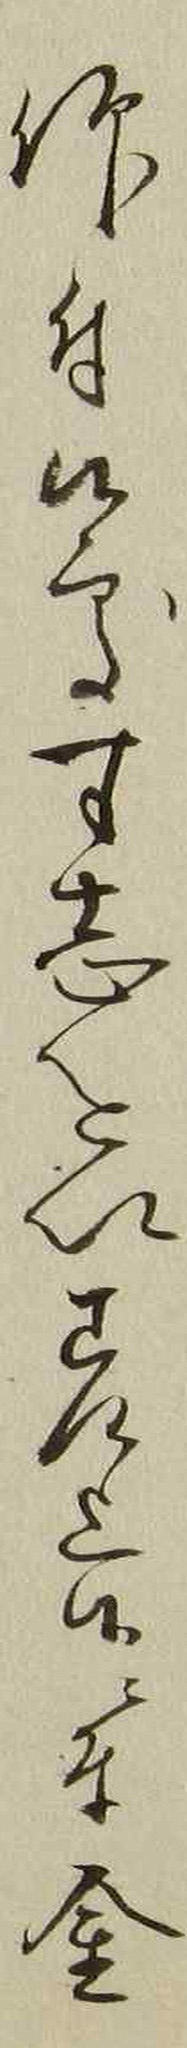仰付候処寸志を以差上候ニ付金
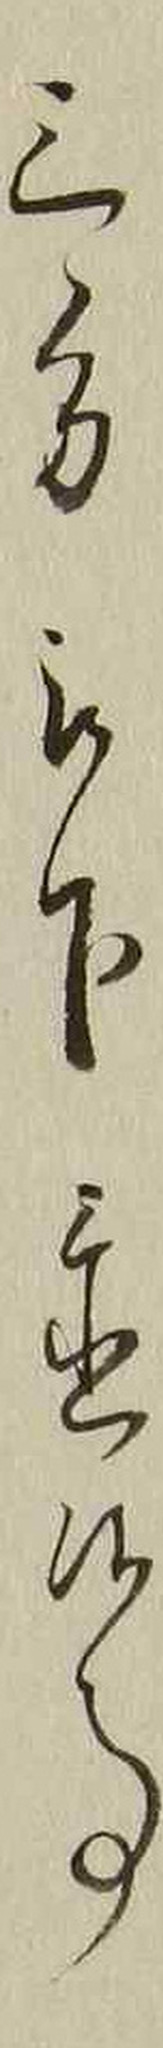三分被下置候事
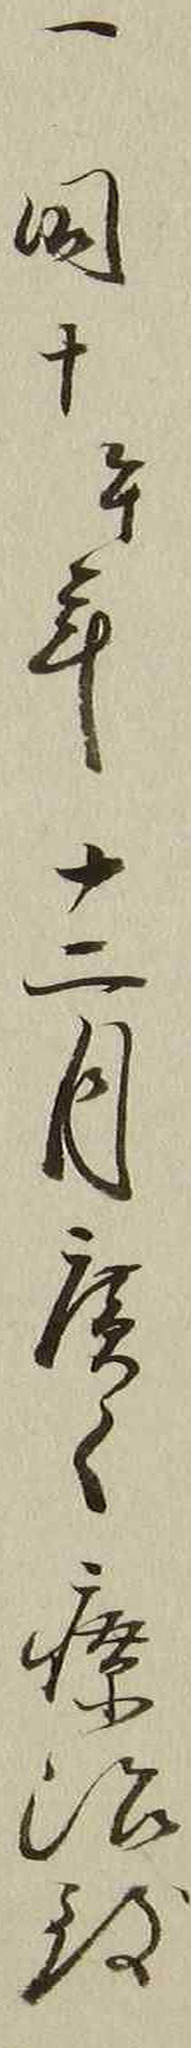一同十午年十二月広く療治致
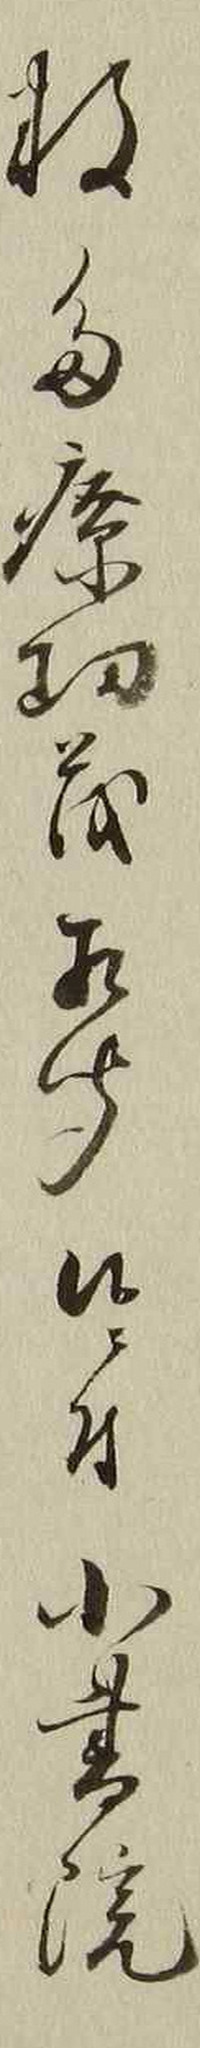数多療功も相聞候ニ付小書院
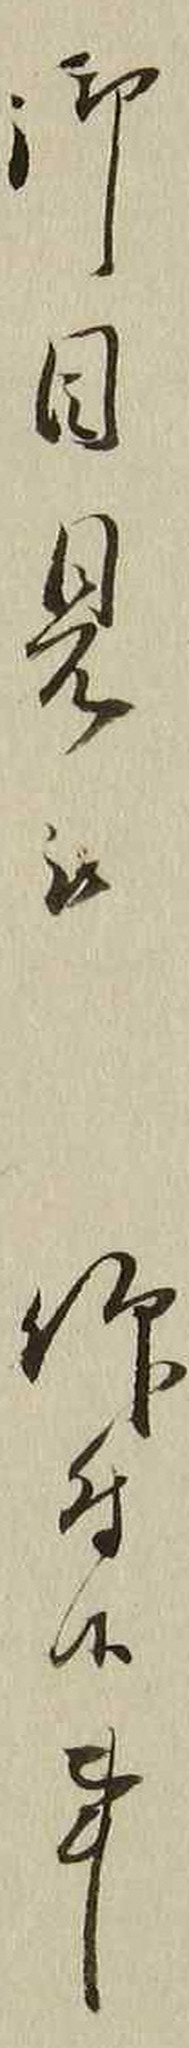御目見被仰付候事
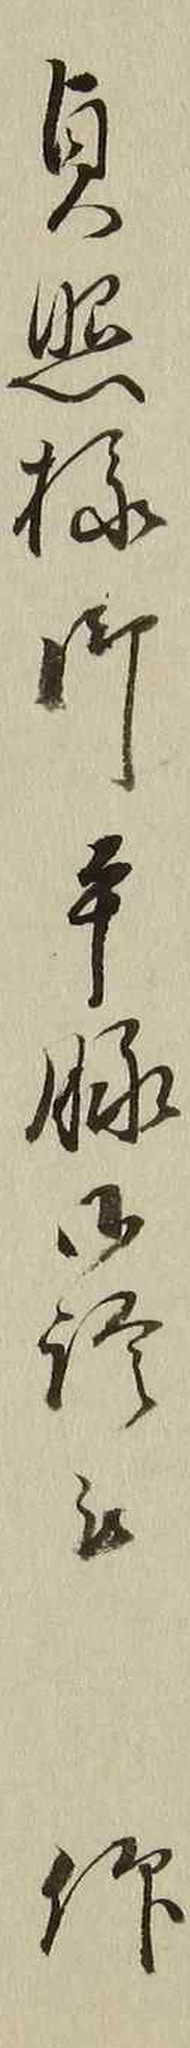貞照様御平脈御診被仰
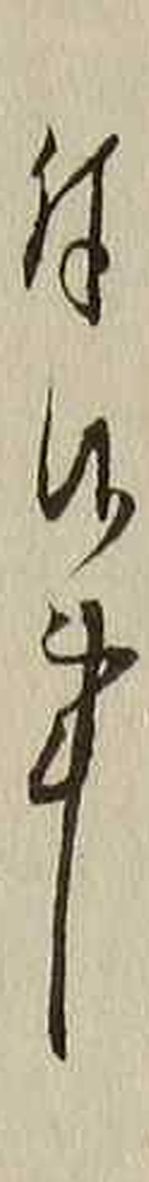付候事
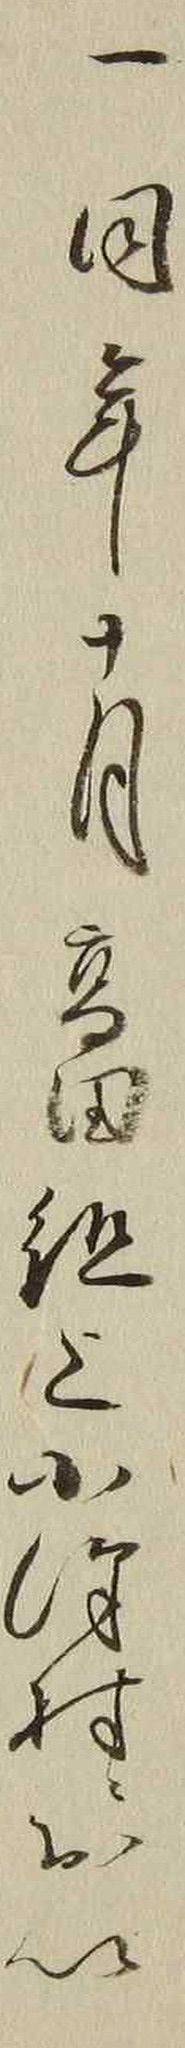一同年十月高田組上小沢村ニおい
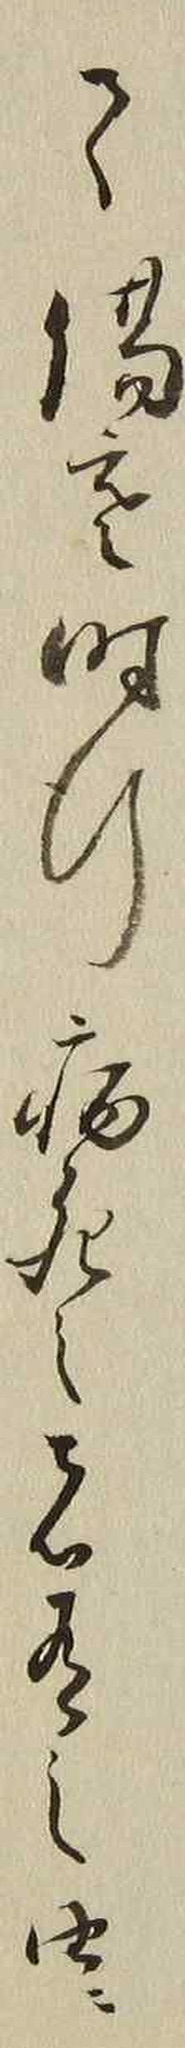て傷寒時行病死之者有之由ニ
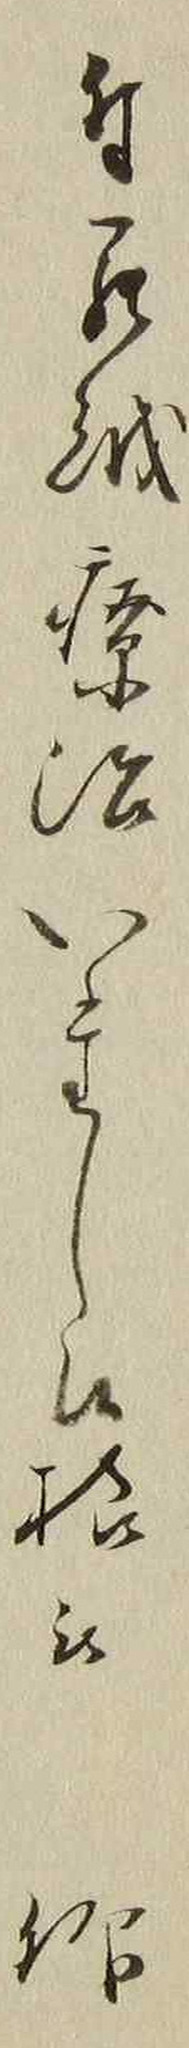付罷越療治いたし候様被仰
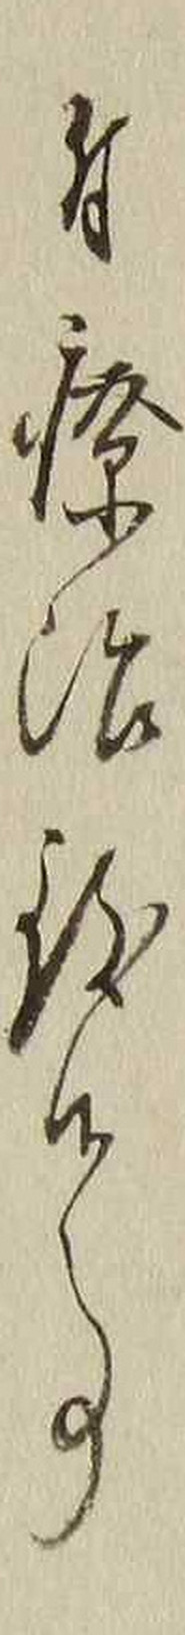付療治致候事
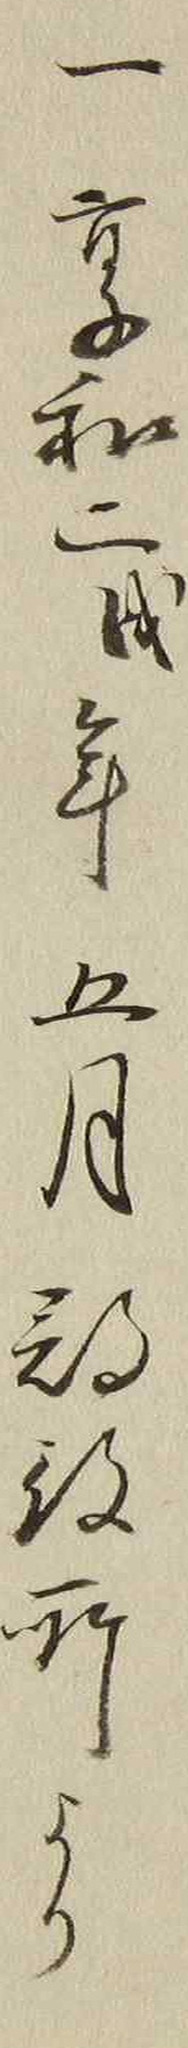一享和二戌年五月郡役所より
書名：諸士系譜　巻之129　た之部5
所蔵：会津若松市立会津図書館
